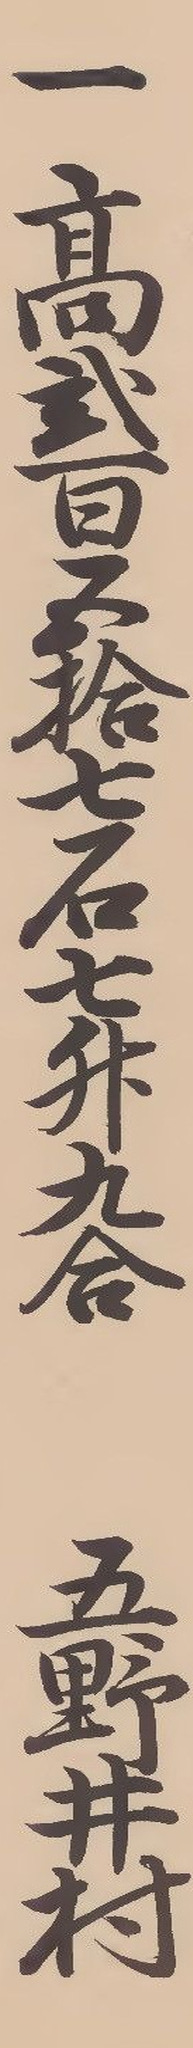一高弐百五拾七石七升九合五野井村
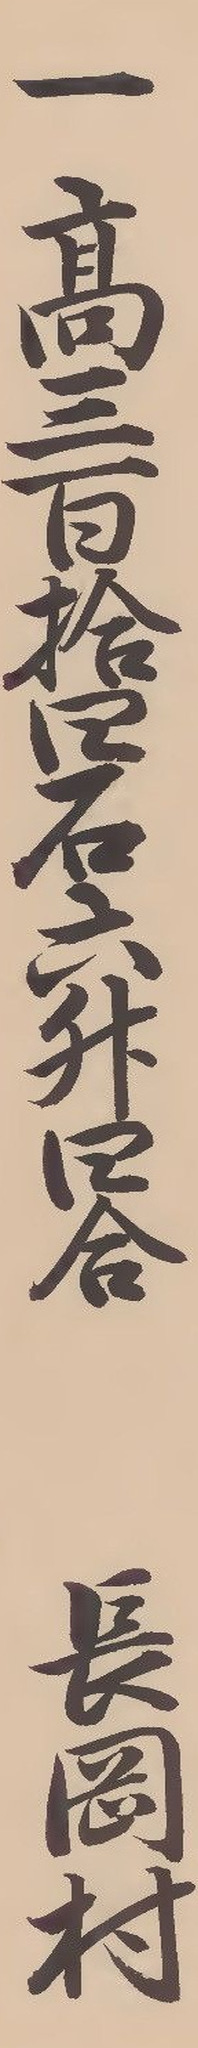一高三百拾四石六升四合長岡村

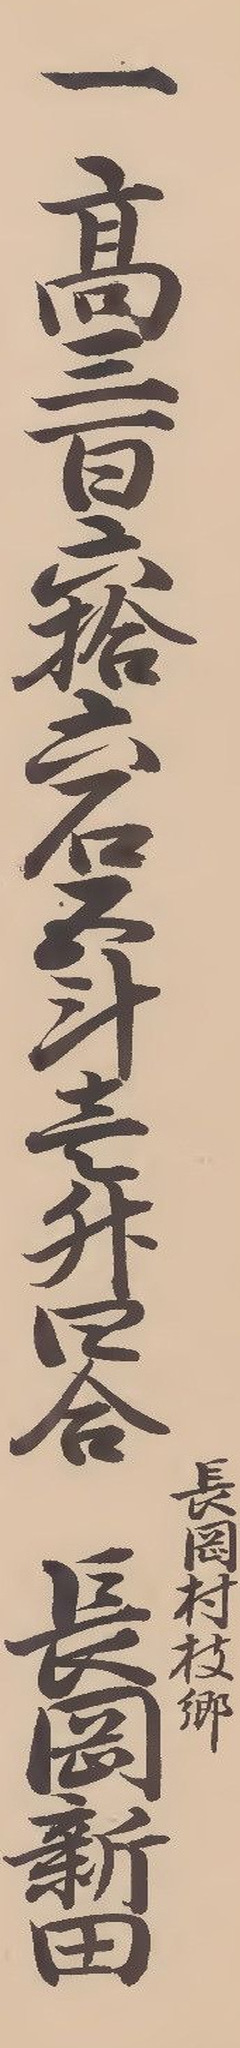一高三百六拾六石五斗壱升四合長岡新田
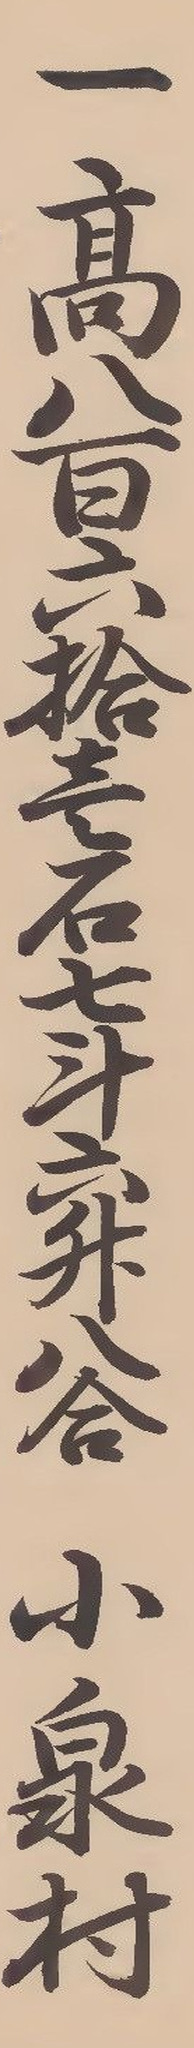一高八百六拾壱石七斗六升八合小泉村
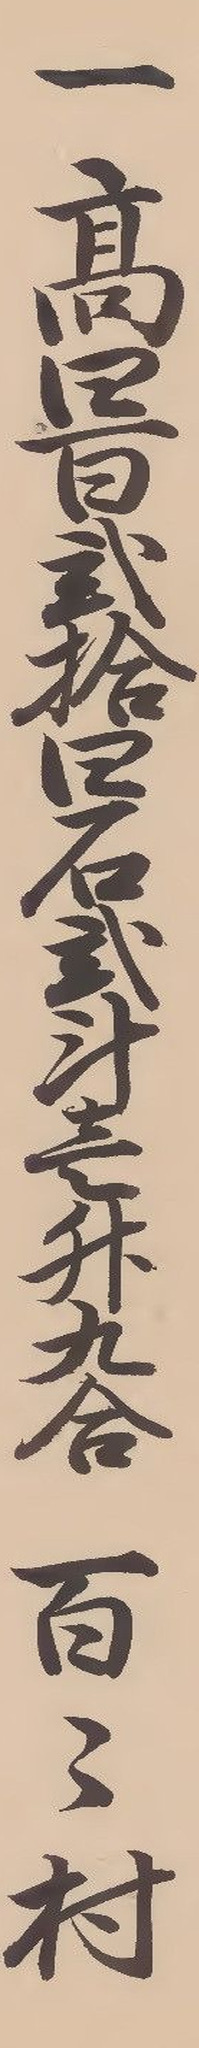一高四百弐拾四石弐斗壱升九合百々村
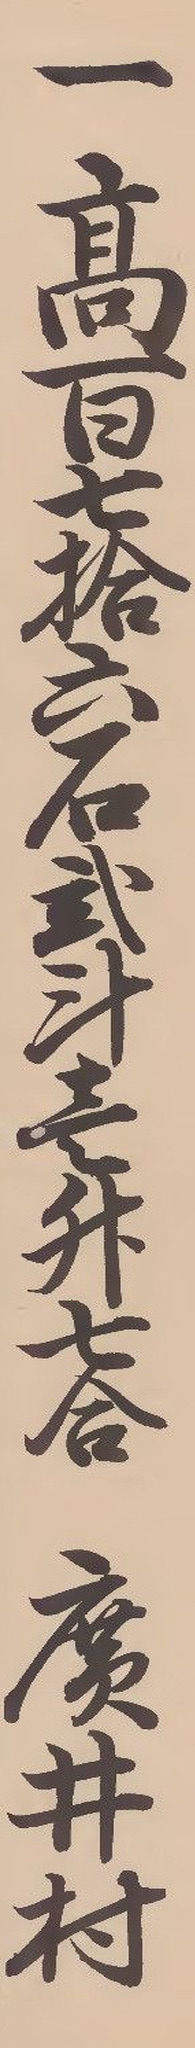一高百七拾六石弐斗壱升七合広井村
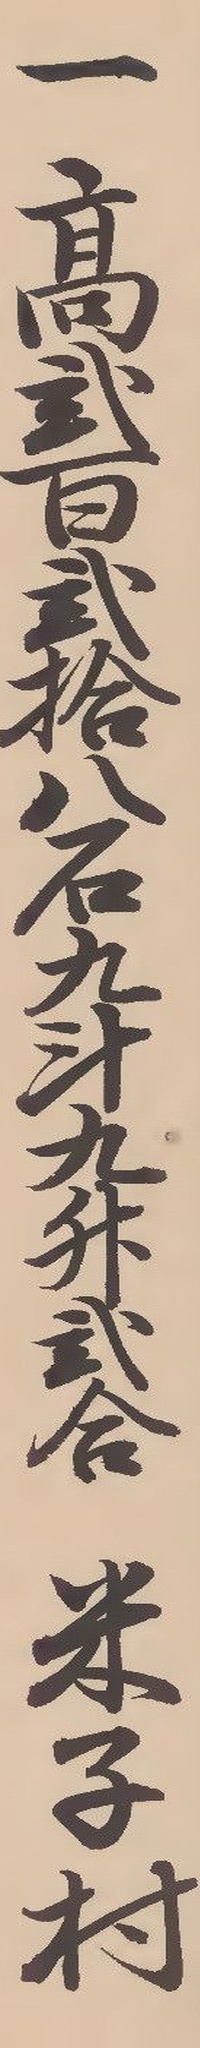一高弐百弐拾八石九斗九升弐合米子村
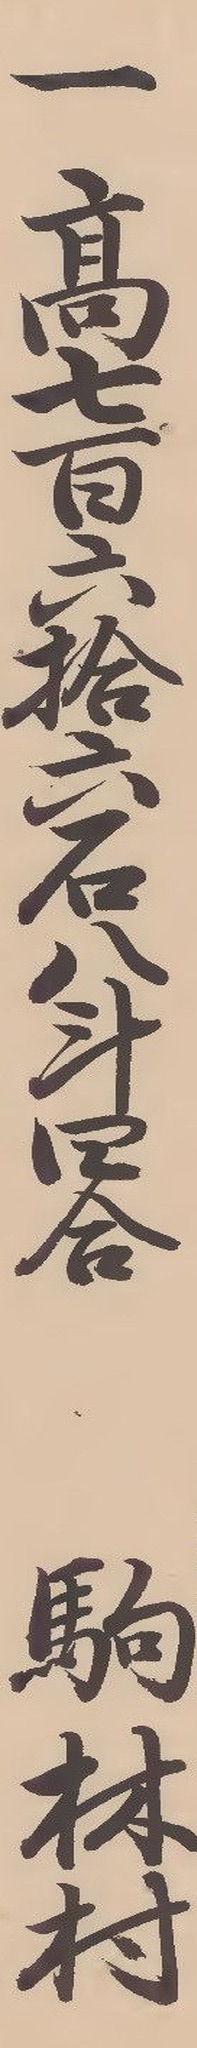一高七百六拾六石八斗四合駒林村
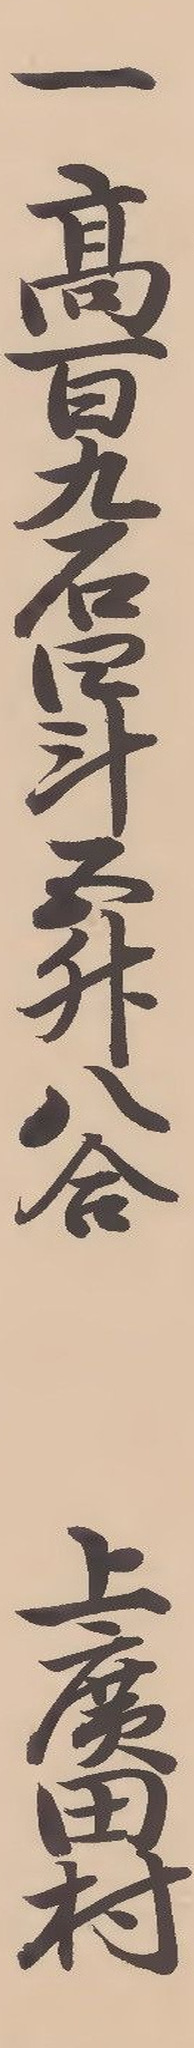一高百九石四斗五升八合上広田村
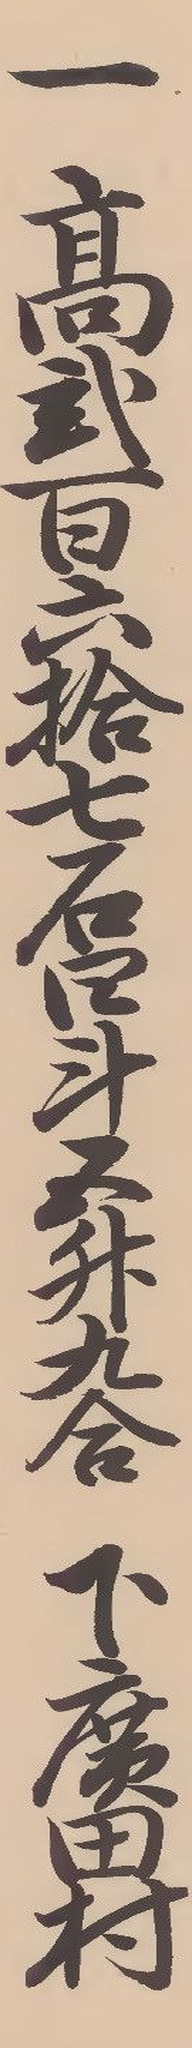一高弐百六拾七石四斗五升九合下広田村

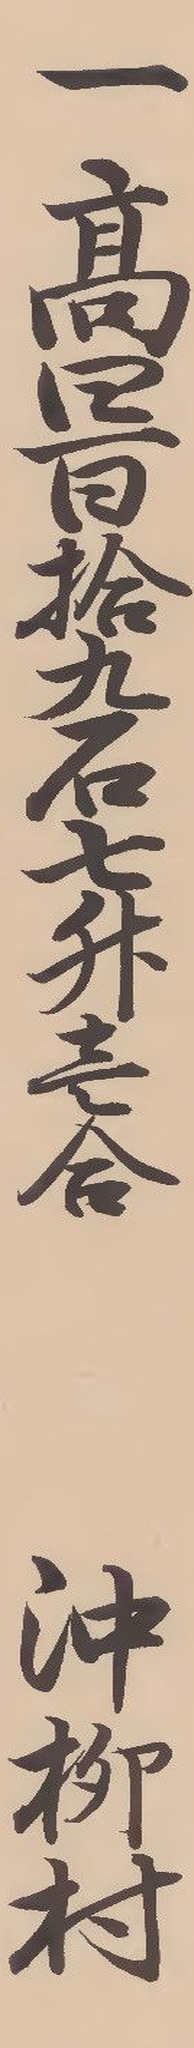一高四百拾九石七升壱合沖柳村
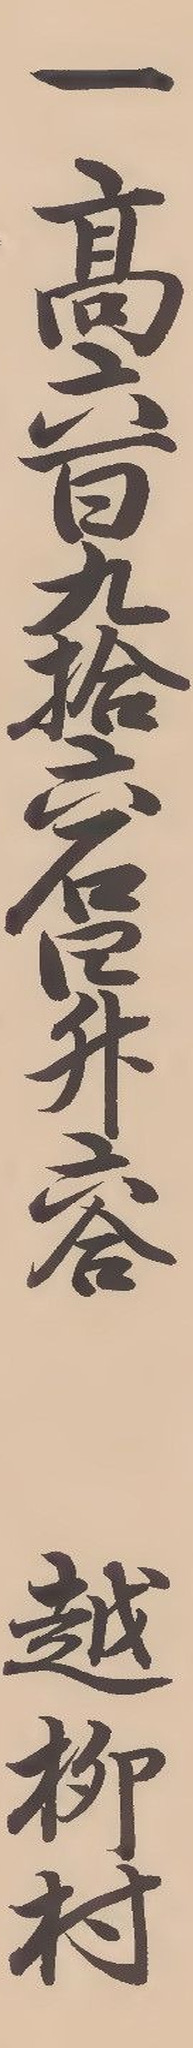一高六百九拾六石四升六合越柳村
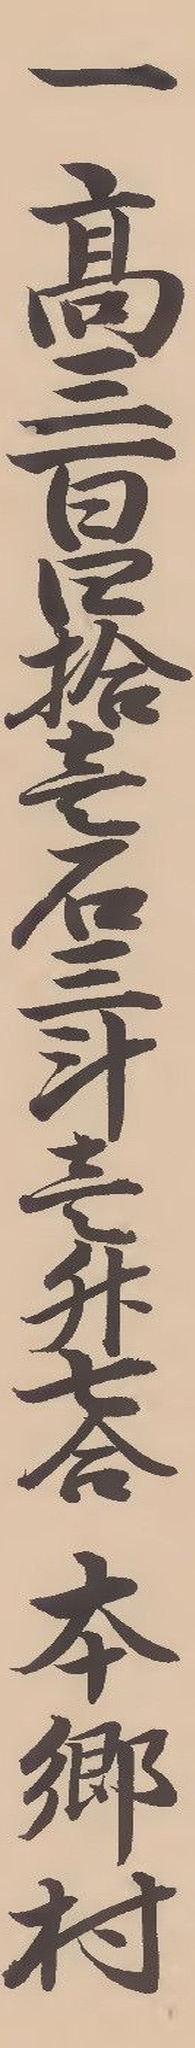一高三百四拾壱石三斗壱升七合本郷村
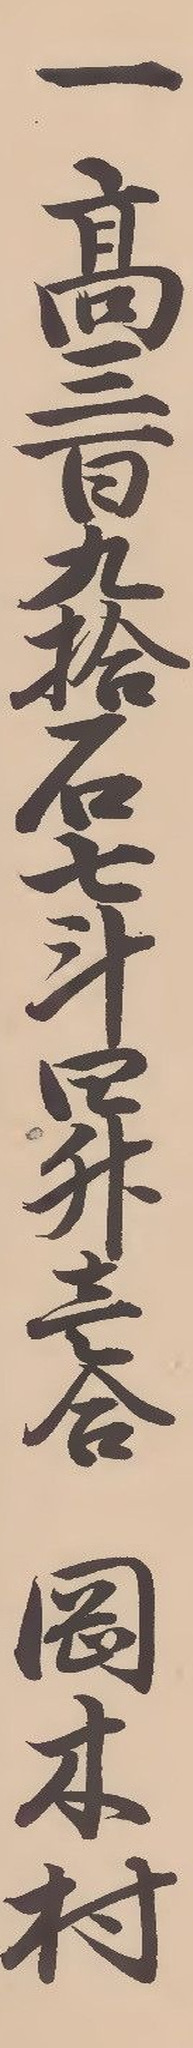一高三百九拾石七斗四升壱合岡木村
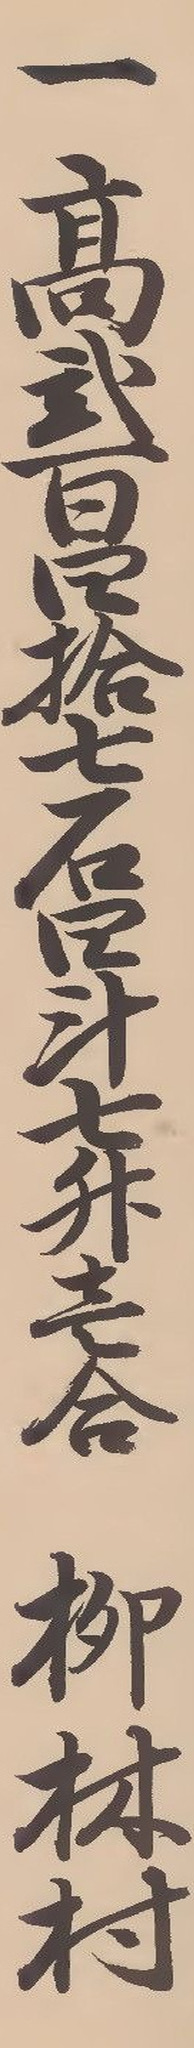一高弐百四拾七石四斗七升壱合柳林村
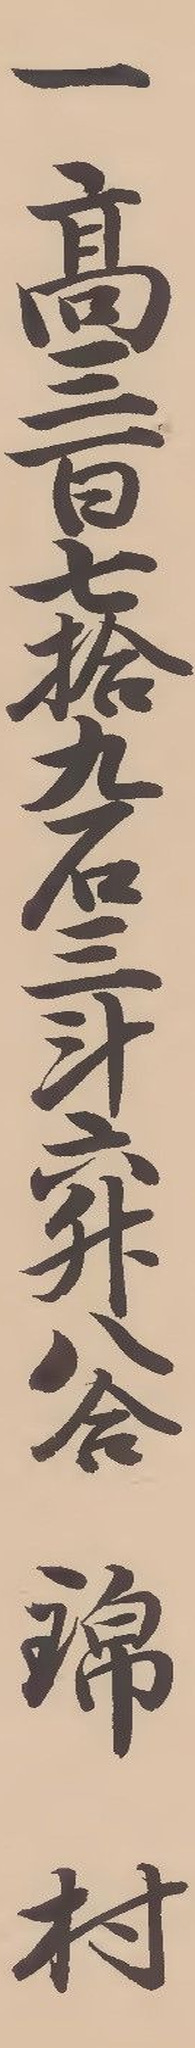一高三百七拾九石三斗六升八合錦村
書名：越後国郷帳　上
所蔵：国立公文書館 National Archives of Japan
